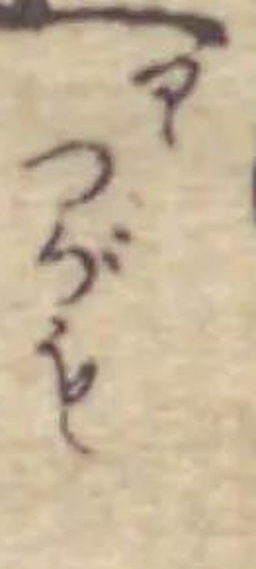つがも
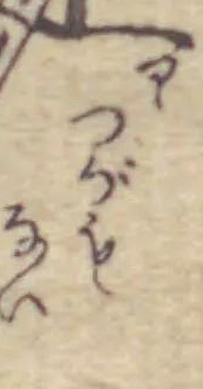つがも
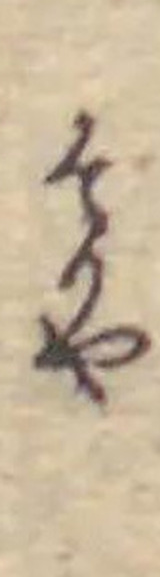そりや
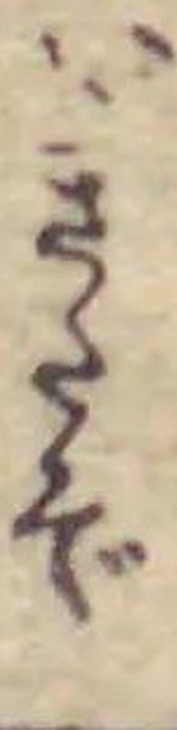きたぞ
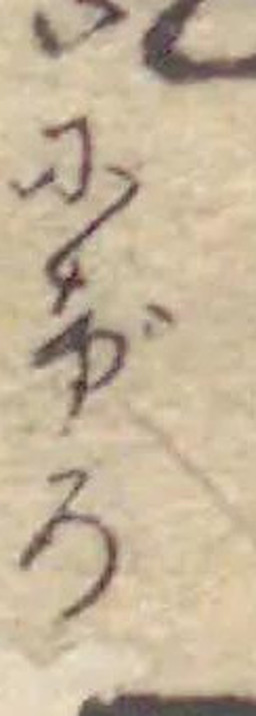にげろ

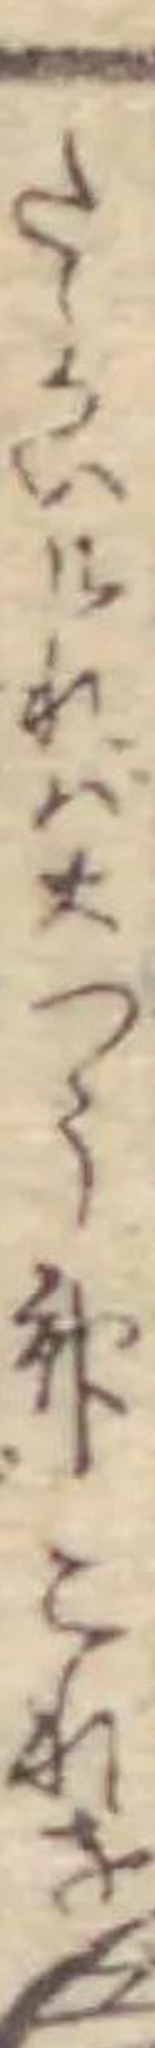たゝかいければ大つう神これを
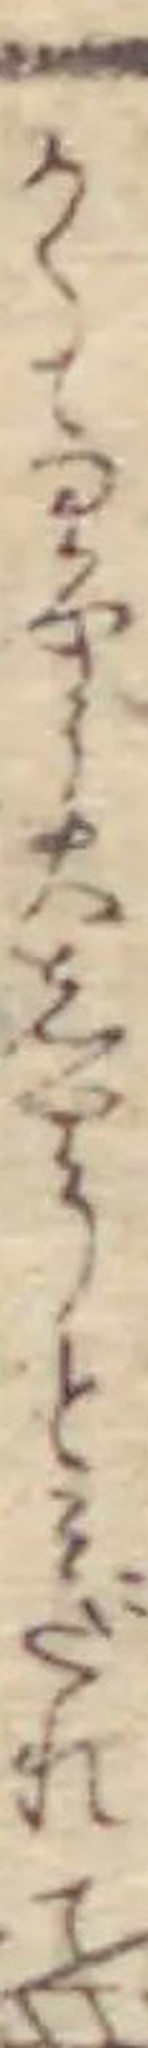かくてりやう大しやうとみだれて
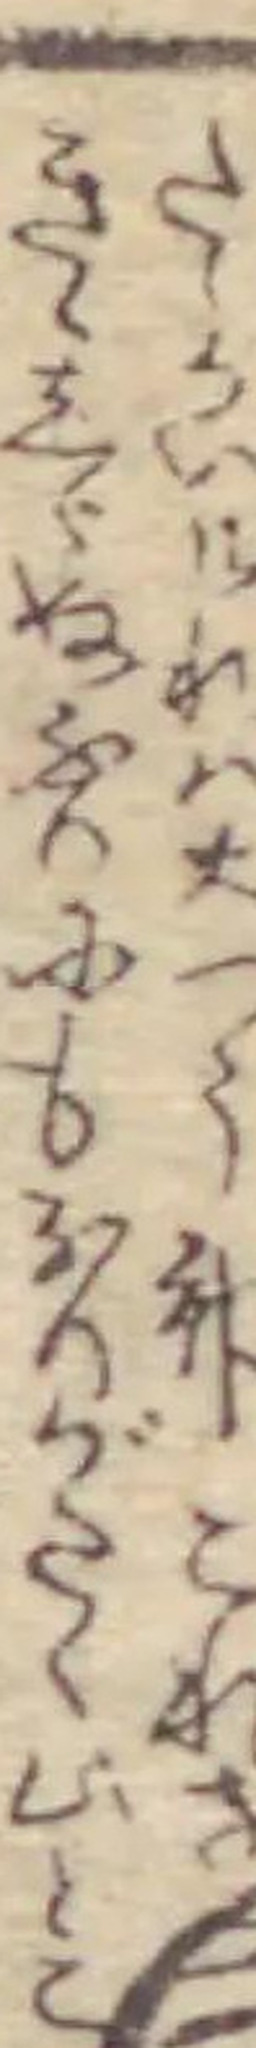きゝしらぬふりにもなりがたく此とこ
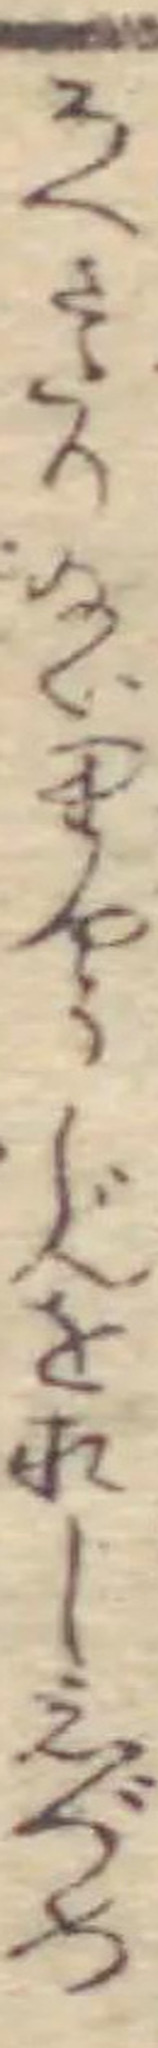ろへきたり給いりやうじんを取ししづめ
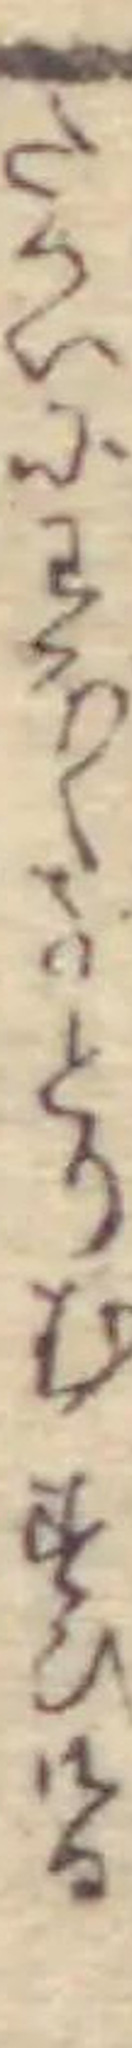たかいにわぼくをとりむすひける
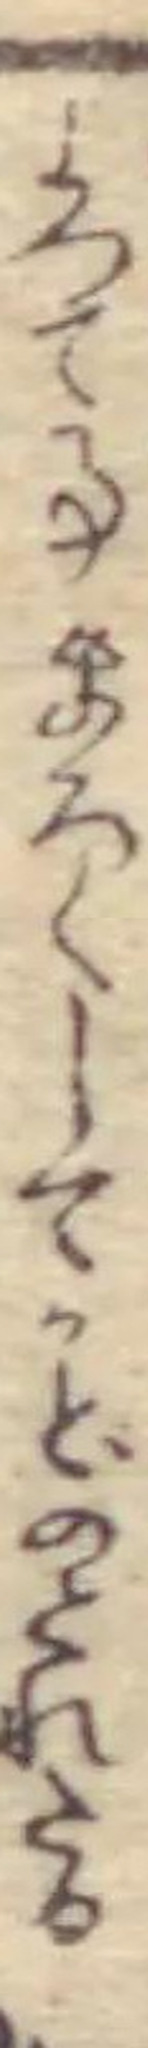よつて事まろくしてかどのとれたる
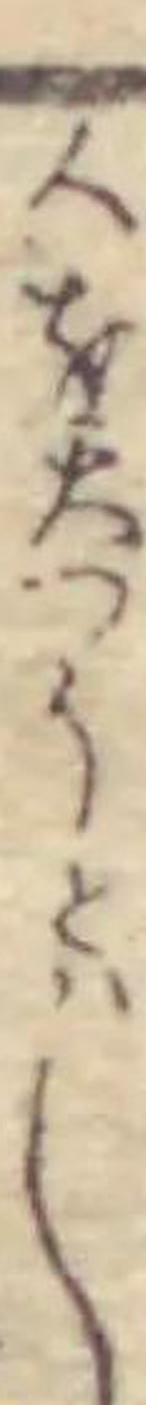人を大つうとは
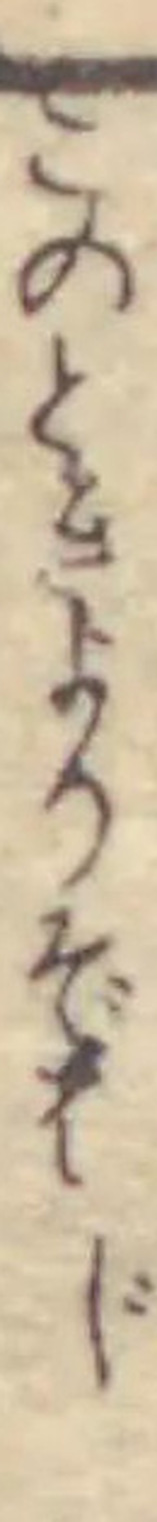このときよりぞはじ
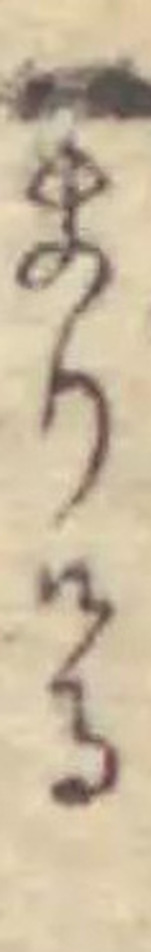まりける
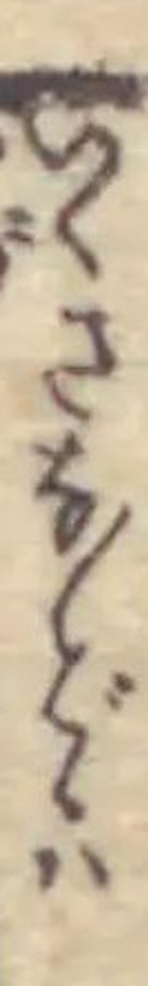いくさなどゝは
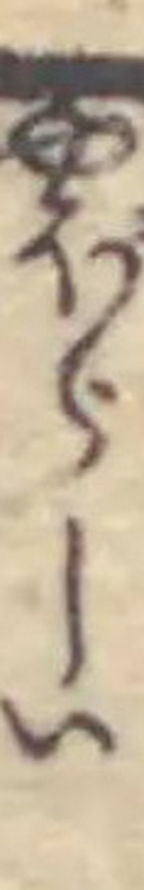やぼらしい
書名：餅酒腹中能同志 2巻
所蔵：国立国会図書館 National Diet Library, JAPAN
